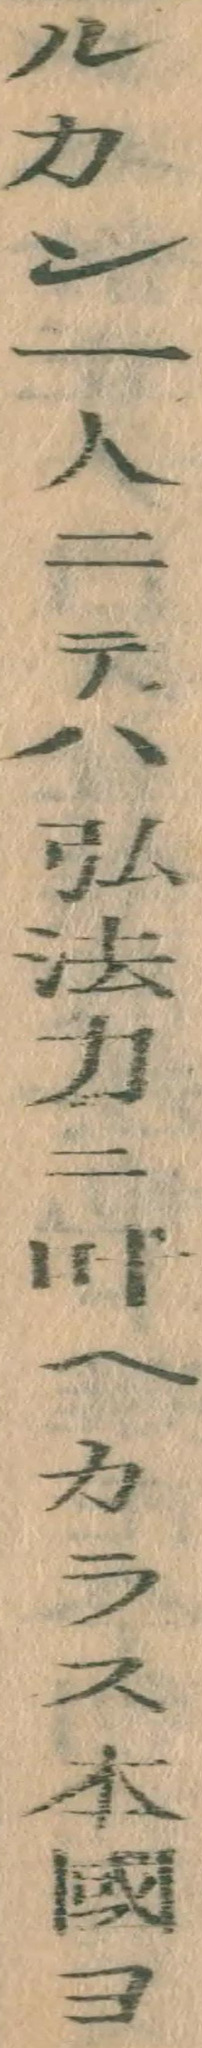ルカン一人ニテハ弘法力ニ叶ヘカラス本国ヨ
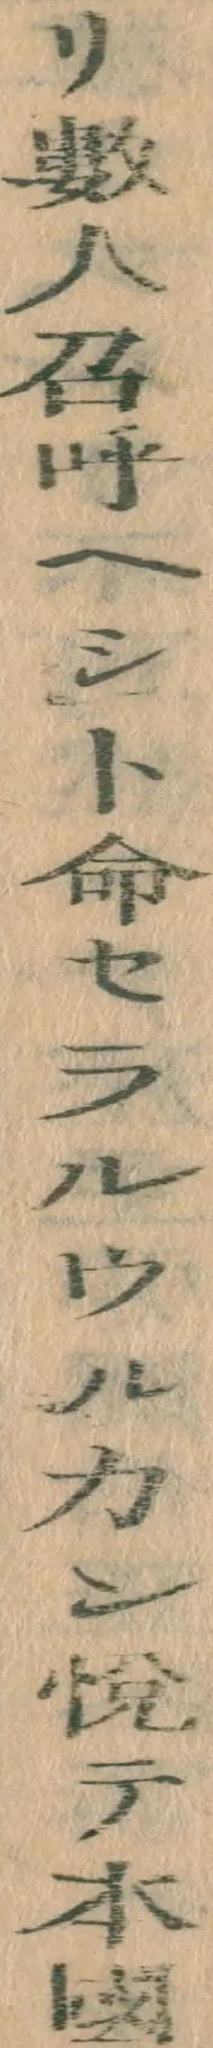リ数人召呼ヘシト命セラルウルカン悦テ本国
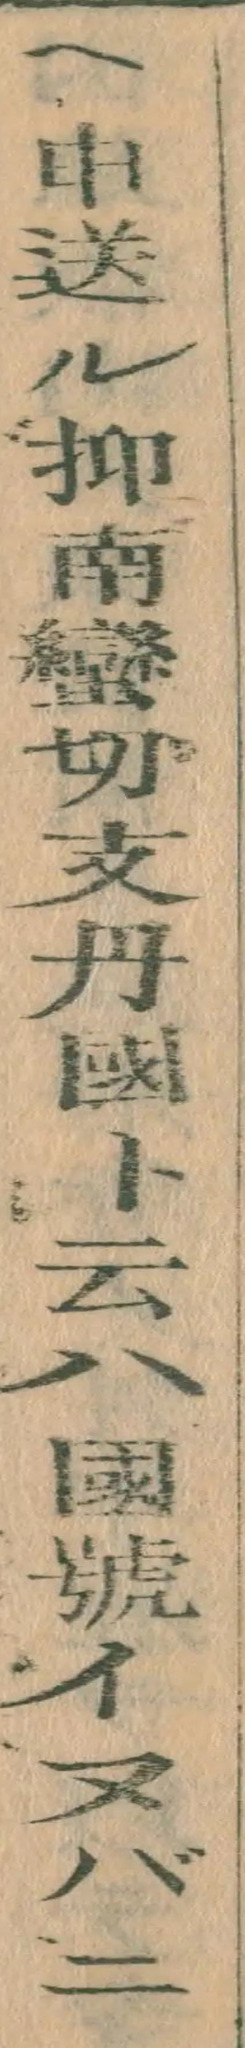ヘ申送ル抑南蛮切支丹国ト云ハ国号イヌバニ
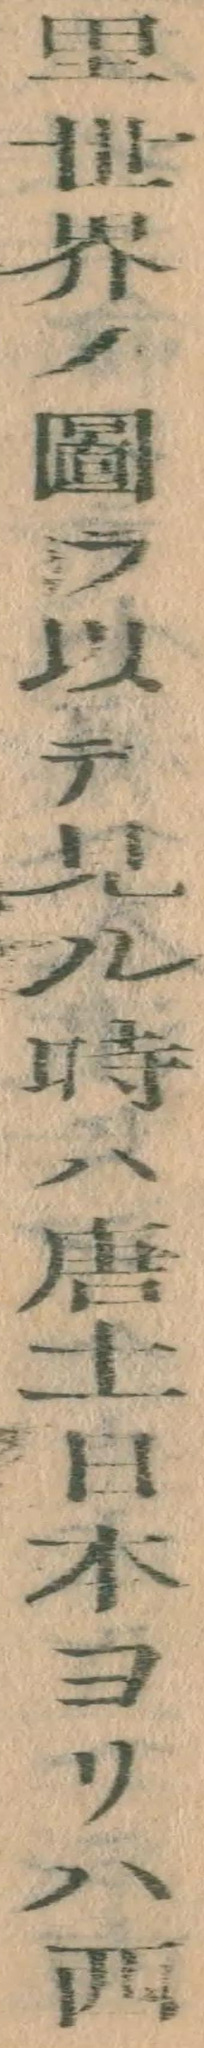里世界ノ図ヲ以テ見ル時ハ唐土日本ヨリハ西
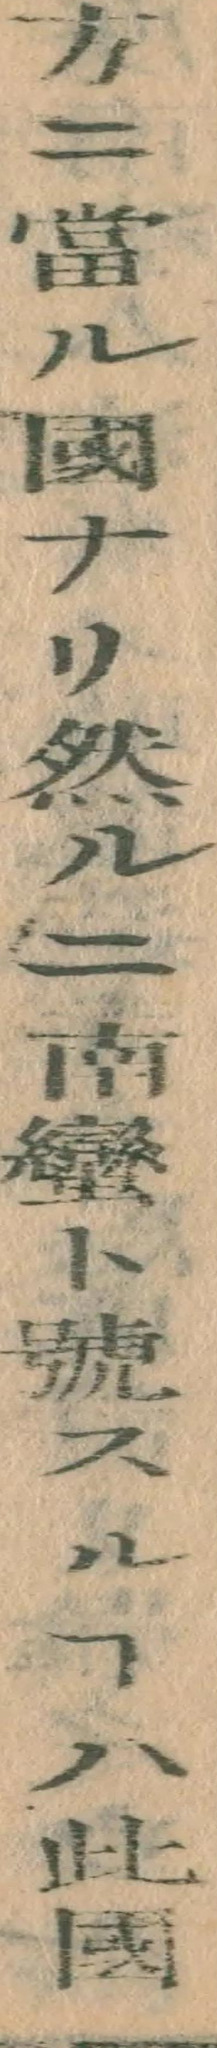方ニ当ル国ナリ然ルニ南蛮ト号スルヿハ此国
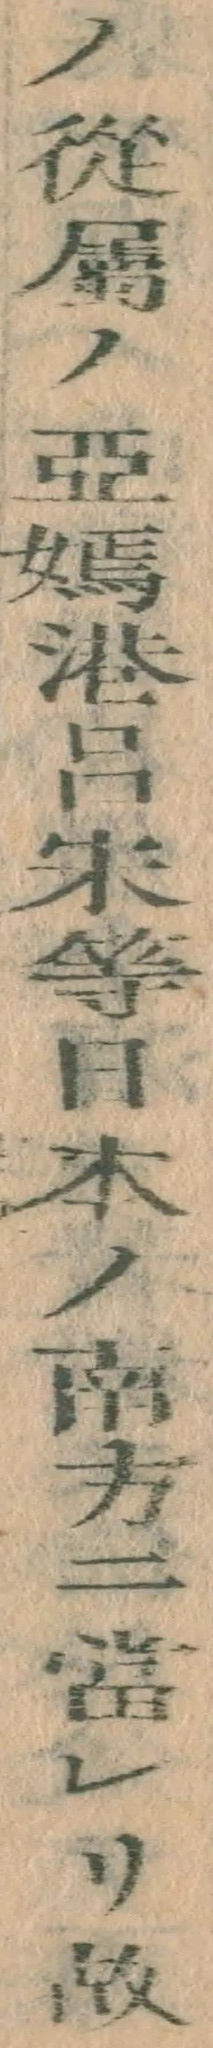ノ従属ノ亜嫣港呂宋等日本ノ南方ニ当レリ故
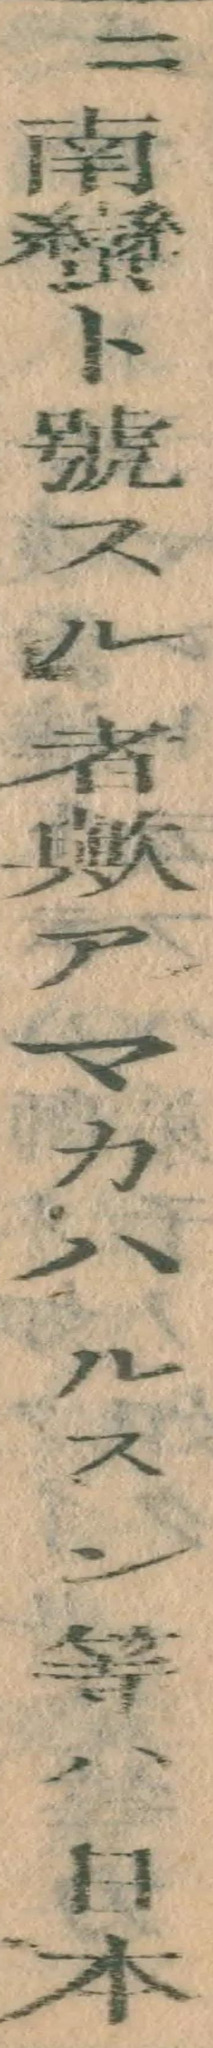ニ南蛮ト号スル者歟アマカハルスン等ハ日本
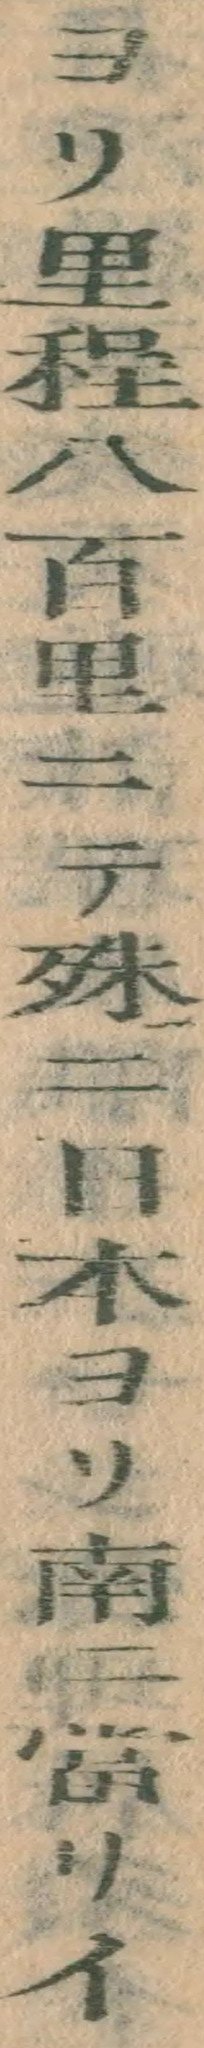ヨリ里程八百里ニテ殊ニ日本ヨリ南ニ当リイ
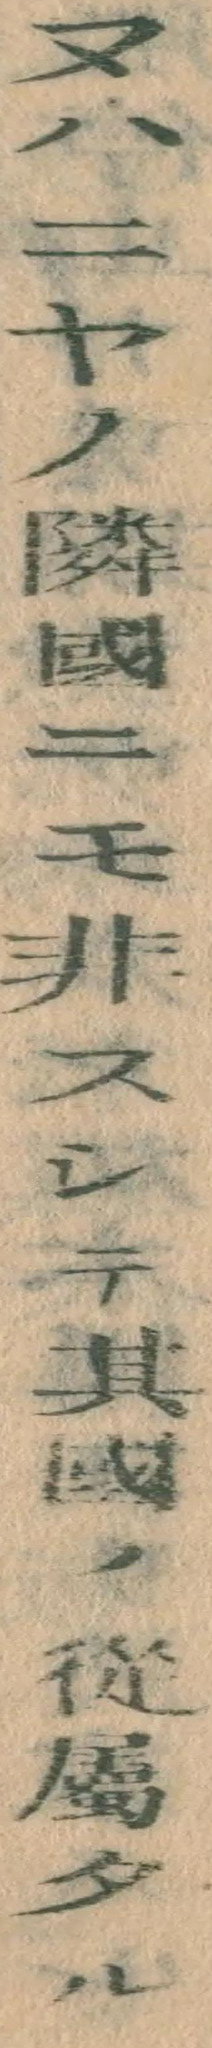ヌハニヤノ隣国ニモ非スシテ其国ノ従属タル
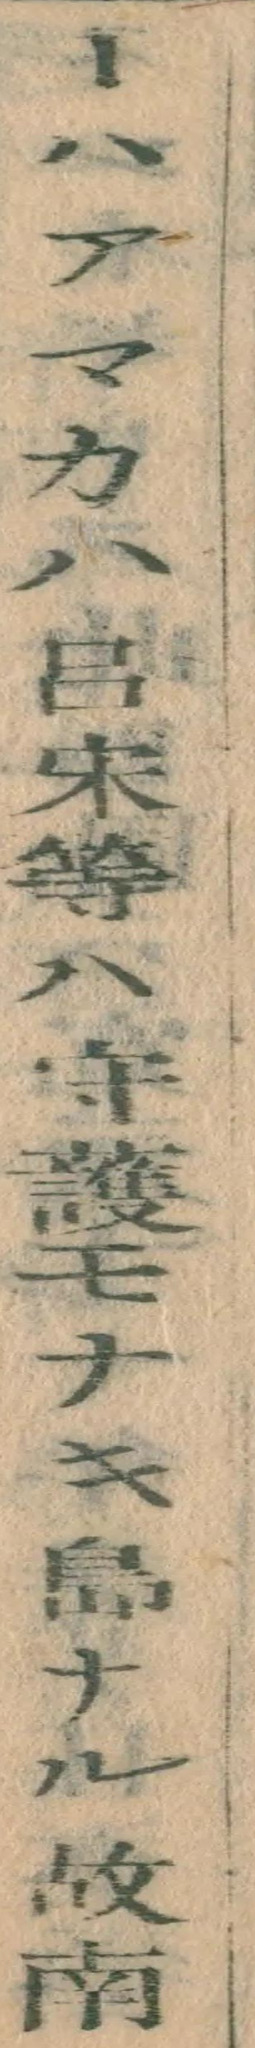ーハアマカハ呂宋等ハ守護モナキ島ナル故南
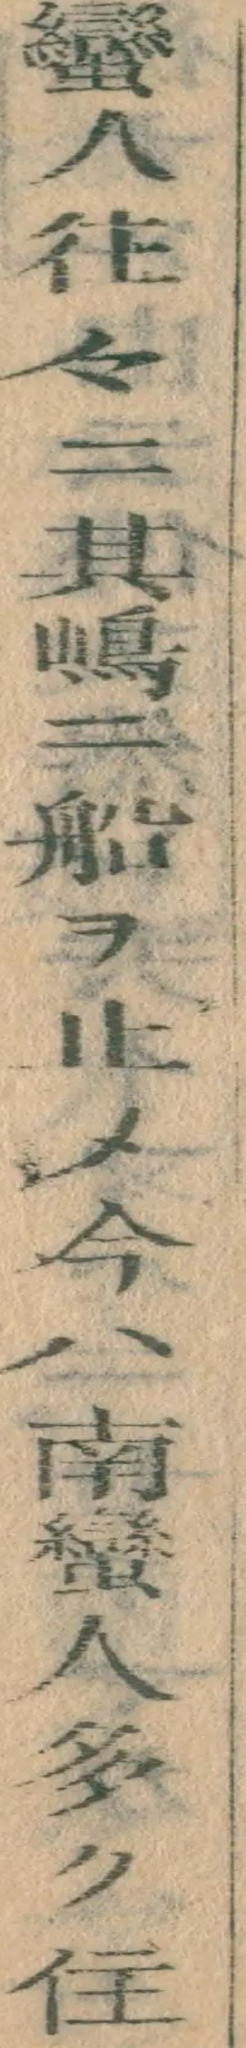蛮人往々ニ其島ニ船ヲ止メ今ハ南蛮人多ク往
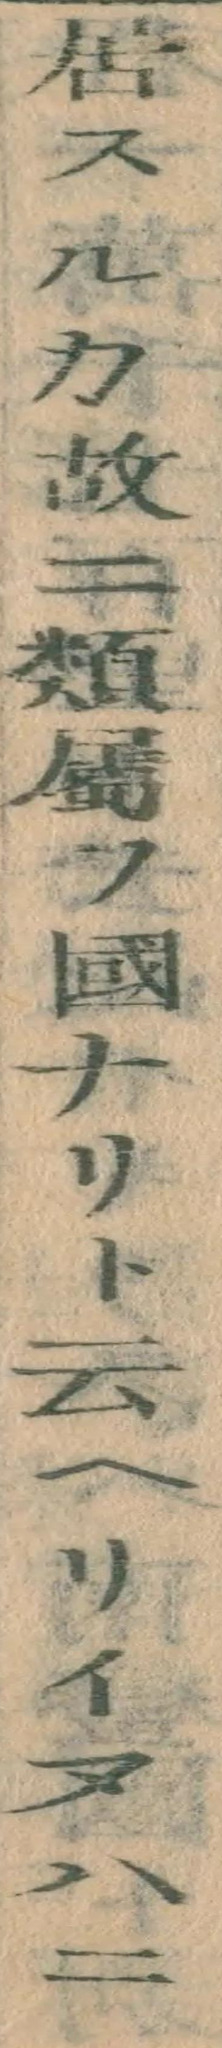居スルカ故ニ類属ノ国ナリト云ヘリイヌハニ

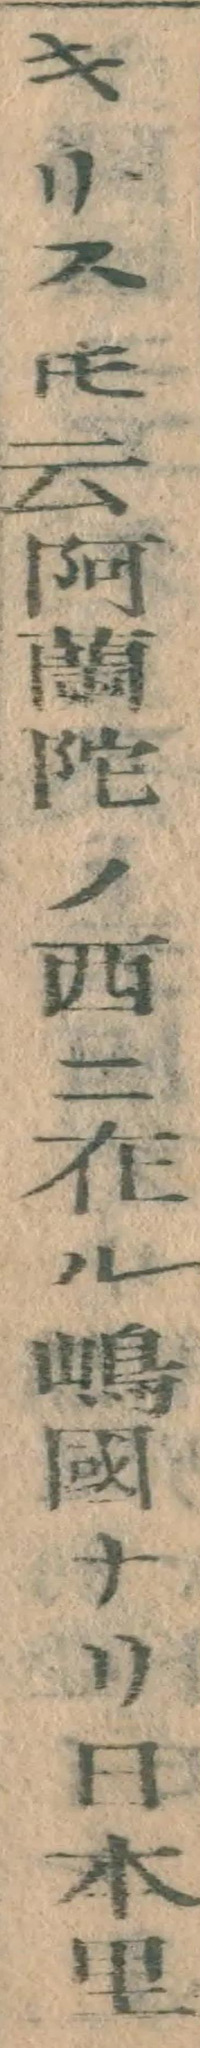キリストモ云阿蘭陀ノ西ニ在ル島国ナリ日本里
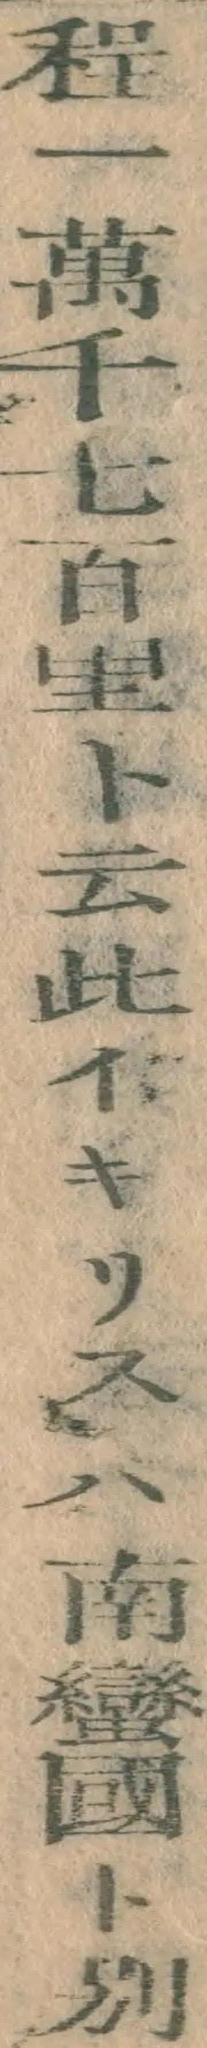程一万千七百里ト云此イキリスハ南蛮国ト別
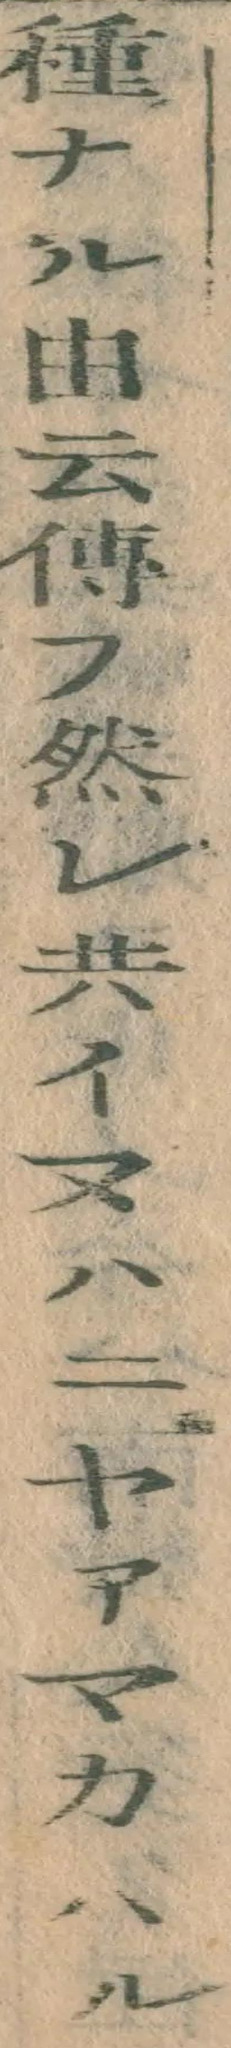種ナル由云伝フ然レ共イヌハニヤアマカハル
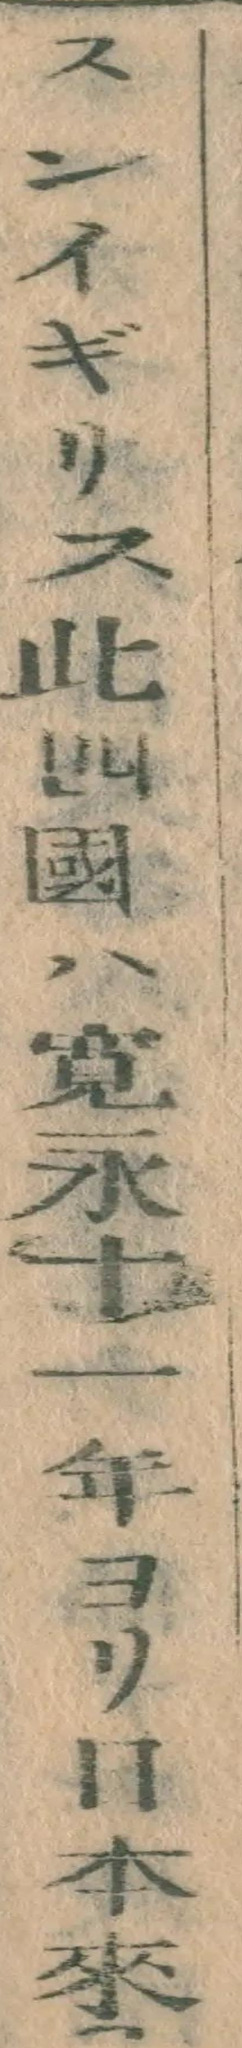スンイギリス此四国ハ寛永十一年ヨリ日本来
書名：南蛮寺興廃記
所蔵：国立国会図書館 National Diet Library, JAPAN
